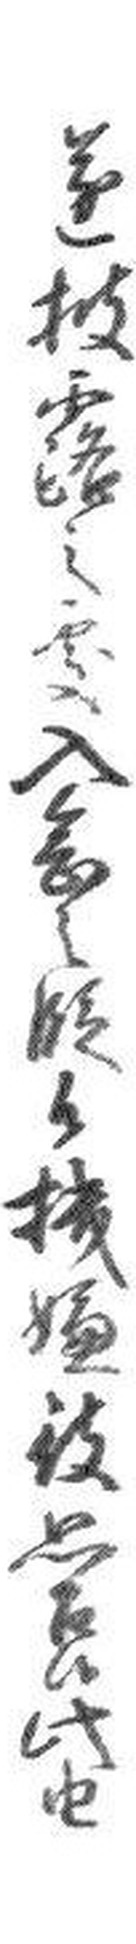遂披露之処入念之段御機嫌被思召候此由
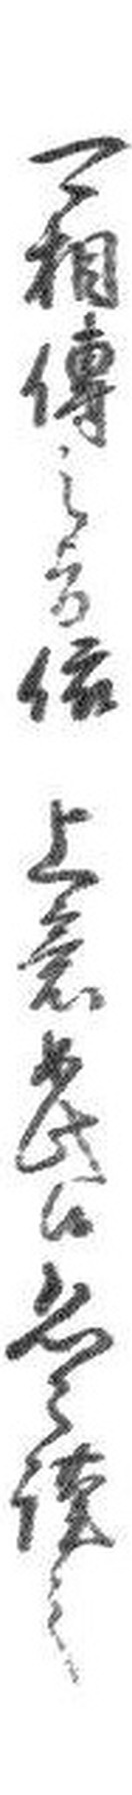可相伝之旨依上意如此候恐々謹言
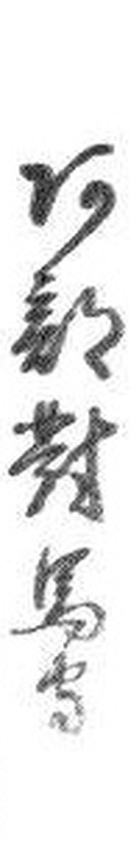阿部対馬守
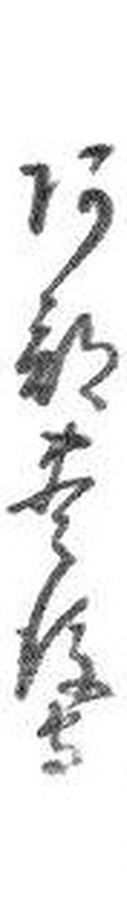阿部豊後守
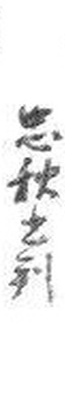忠秋書判
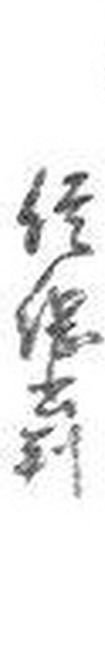信綱書判
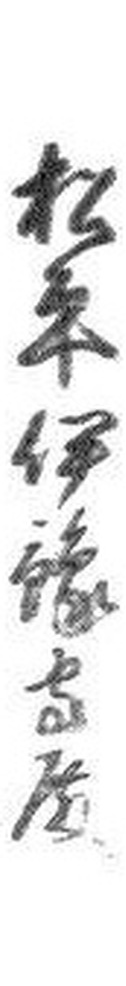松平伊予守殿
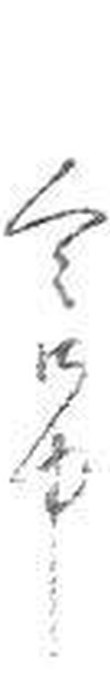人々御中

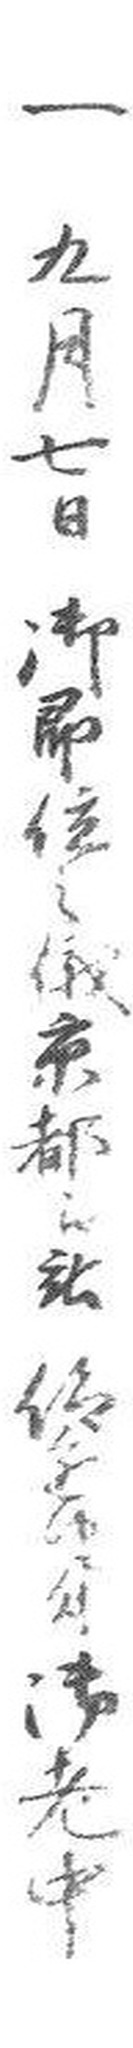一九月七日御即位之儀京都江被仰進候ニ付御老中
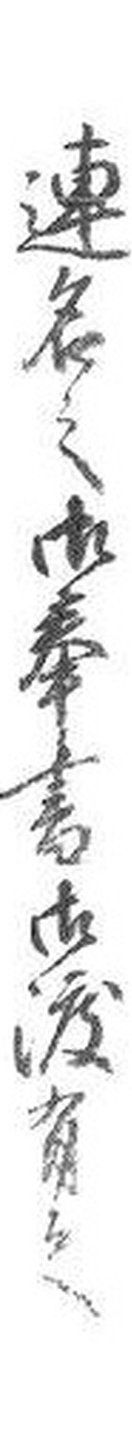連名之御奉書御渡有之
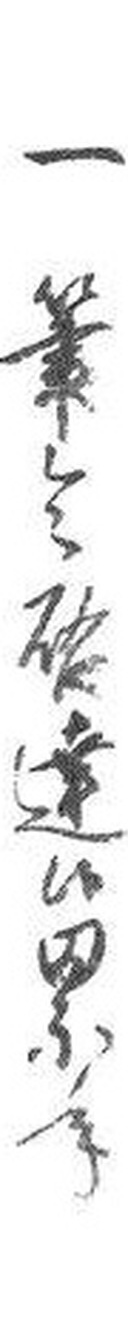一筆令啓達候累年
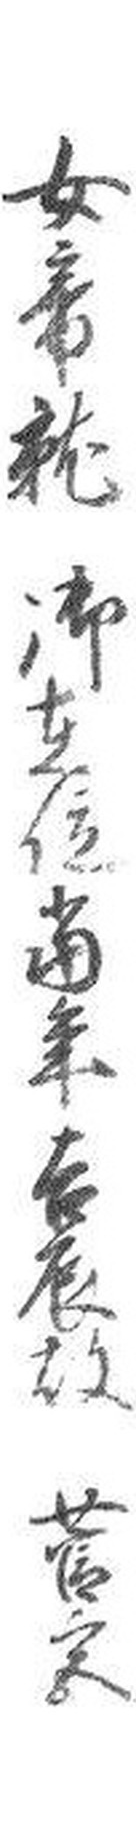女帝就御在位当年吉辰故菅宮
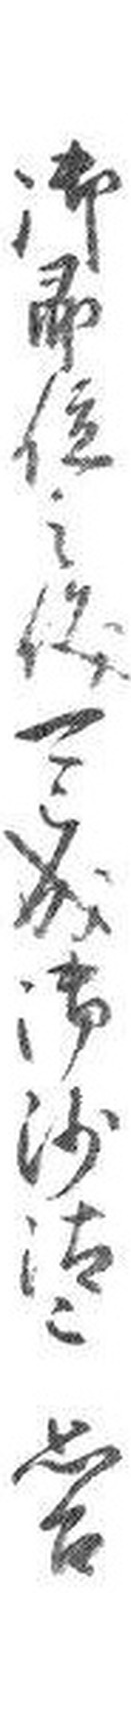御即位之儀可被成御沙汰被思召
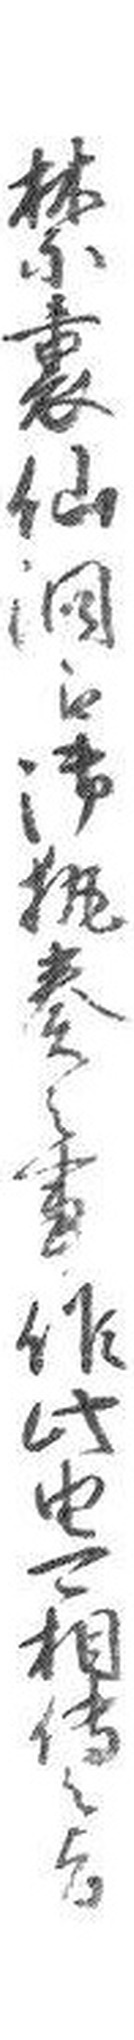禁裏仙洞江御執奏之事候此由可相伝之旨
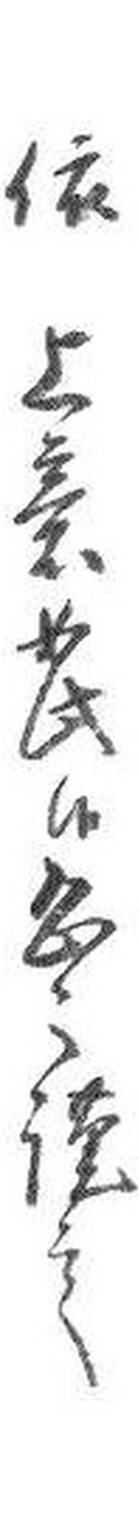依上意如此候恐々謹言
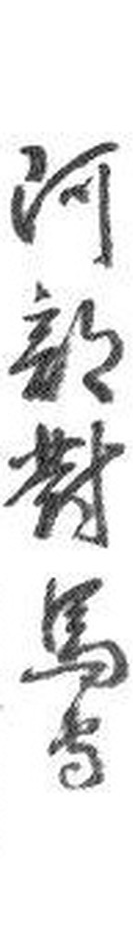阿部対馬守
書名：家譜 四 忠昌公 従寛永七年到正保四年
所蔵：福井県文書館 Fukui Prefectural Archives
